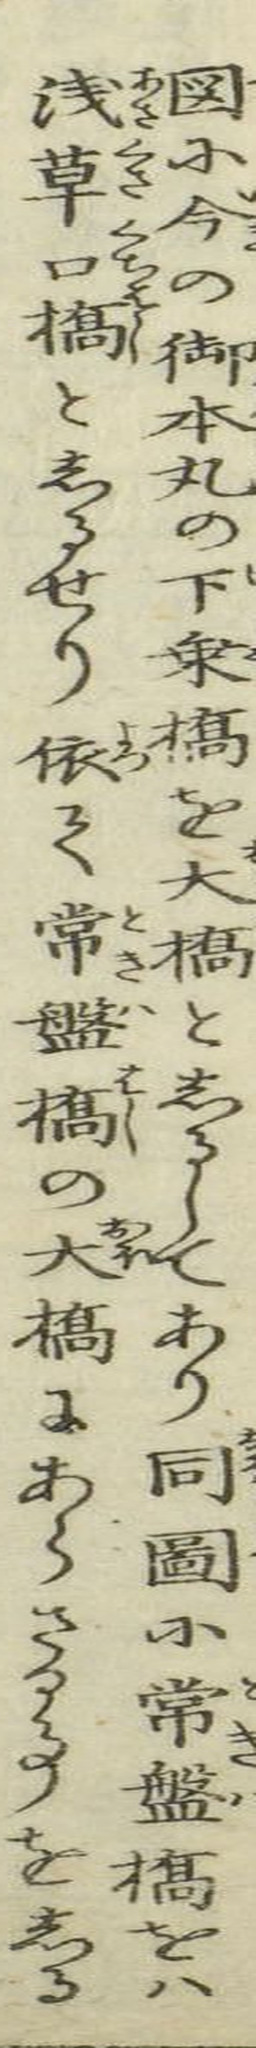浅草口橋としるせり依て常盤橋の大橋にあらさる事をしるへし
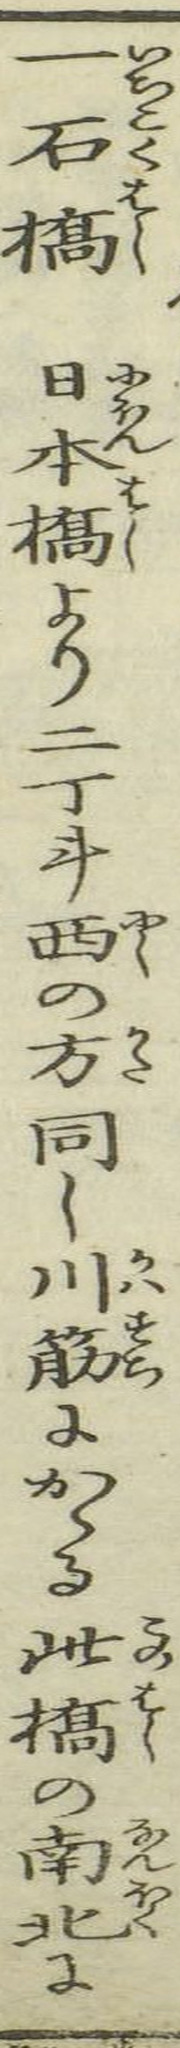一石橋日本橋より二丁斗西の方同し川筋にかゝる此橋の南北に

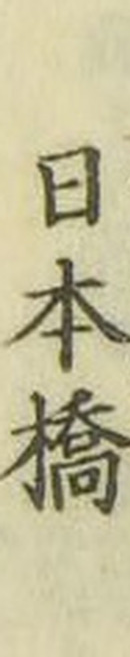日本橋
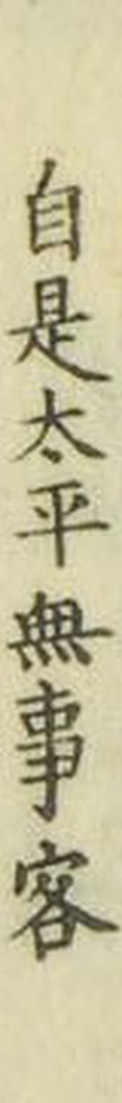自是太平無事客
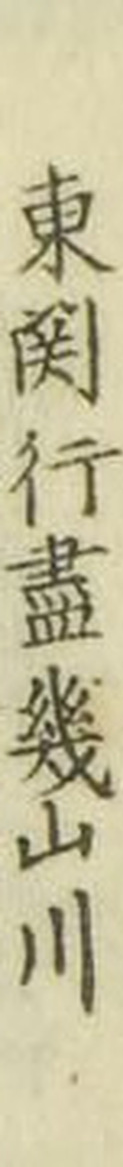東関行尽幾山川
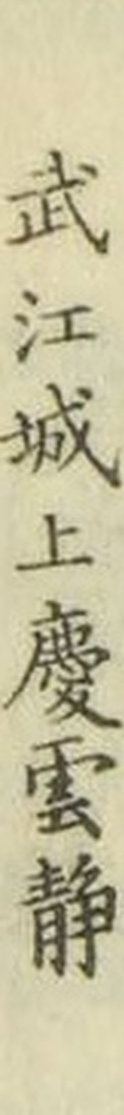武江城上慶雲静
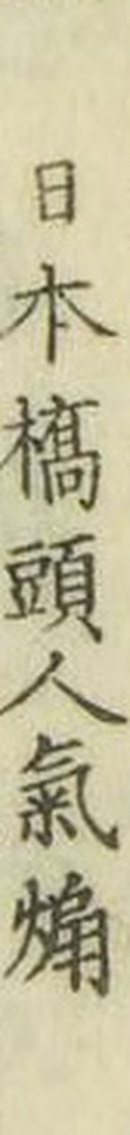日本橋頭人気煽
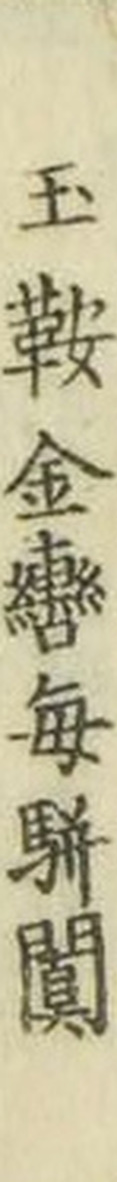玉鞍金轡毎駢闐
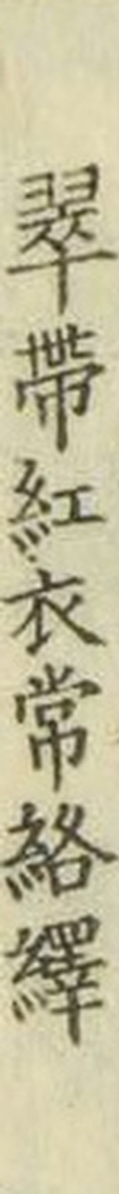翠帯紅衣常絡繹
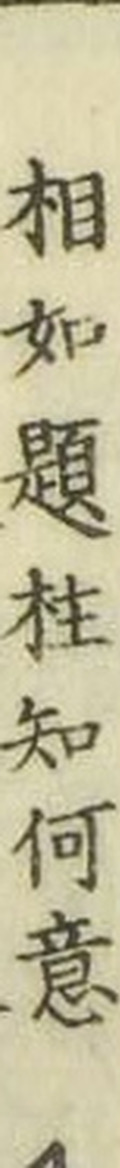相如題柱知何意
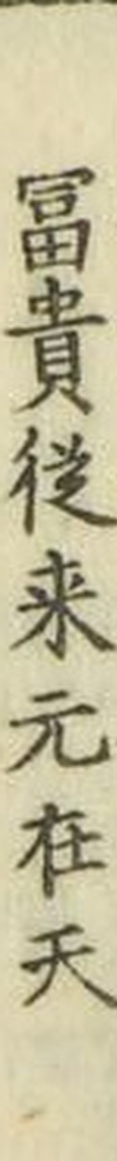富貴従来元在天
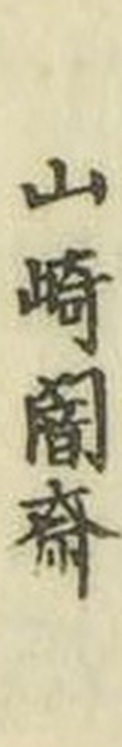山崎闇斎

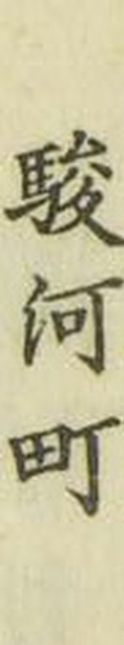駿河町
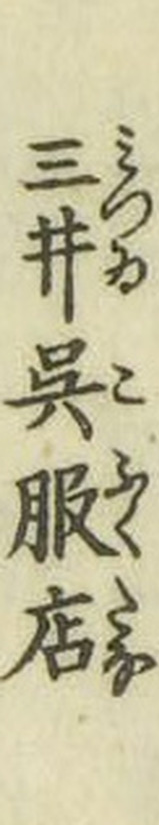三井呉服店
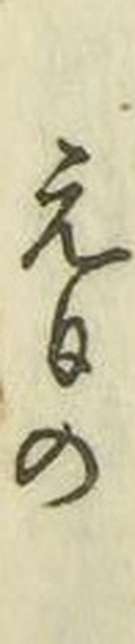元日の
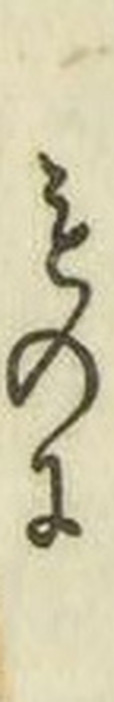ものに
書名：江戸名所図会 20巻 巻之1
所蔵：東京学芸大学教育コンテンツアーカイブ
